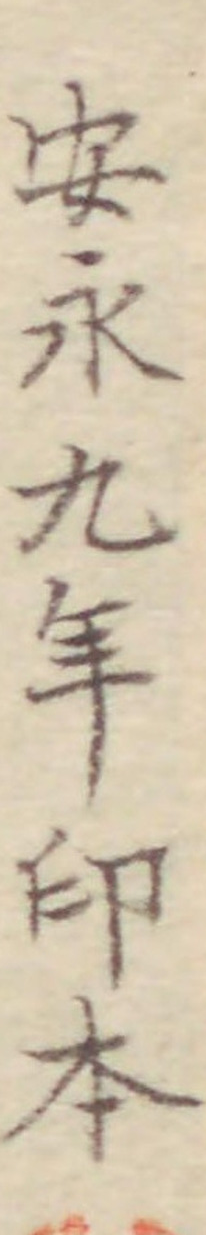安永九年印本
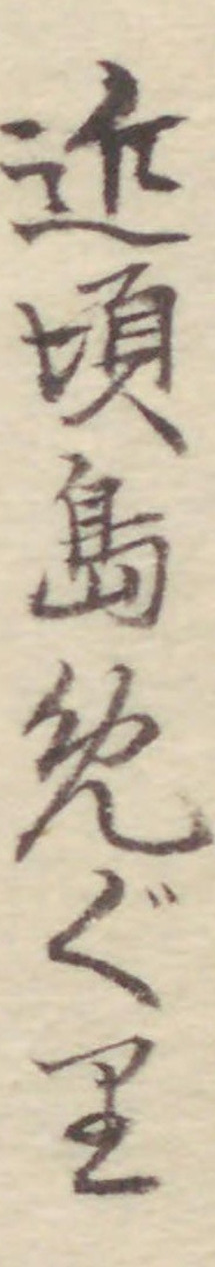近頃島めぐり
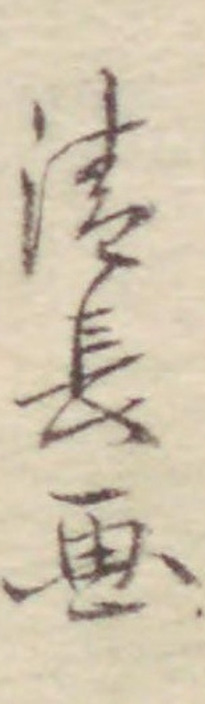清長画
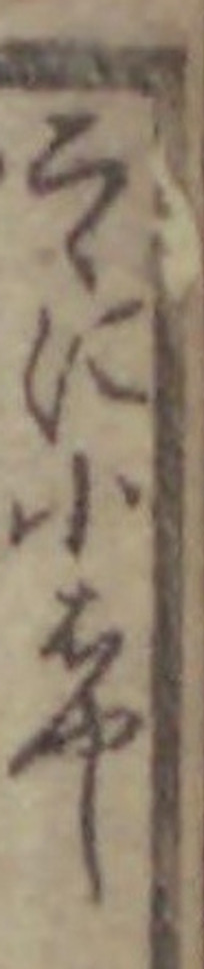こゝに小はやし
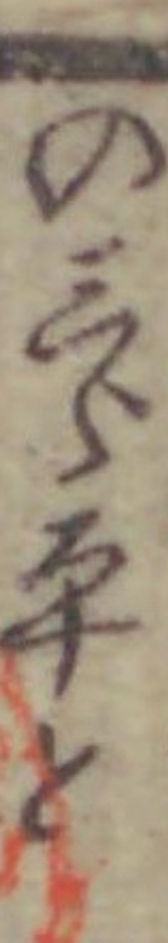の三郎平と
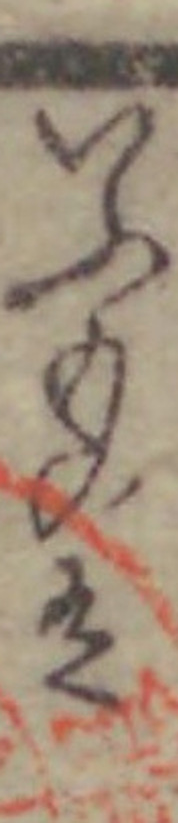いふもの有
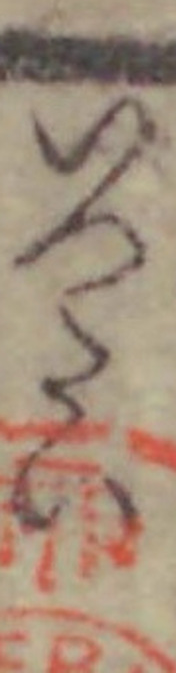いつたい
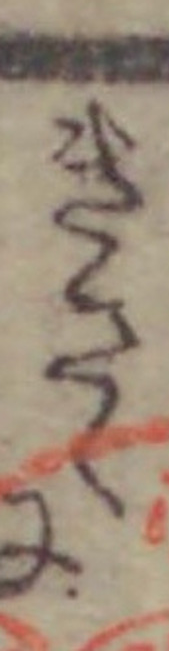きさくに
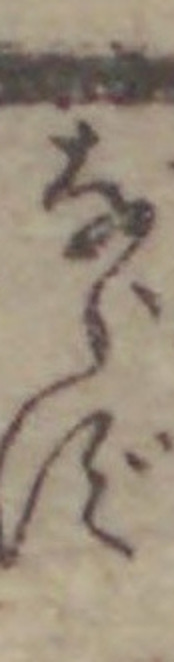ならず
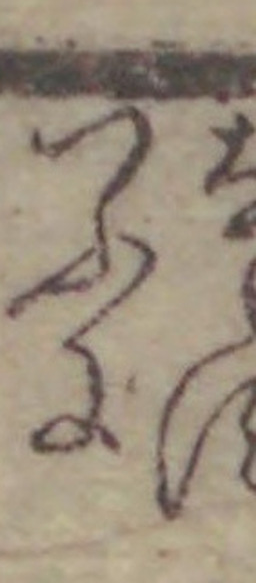つふに
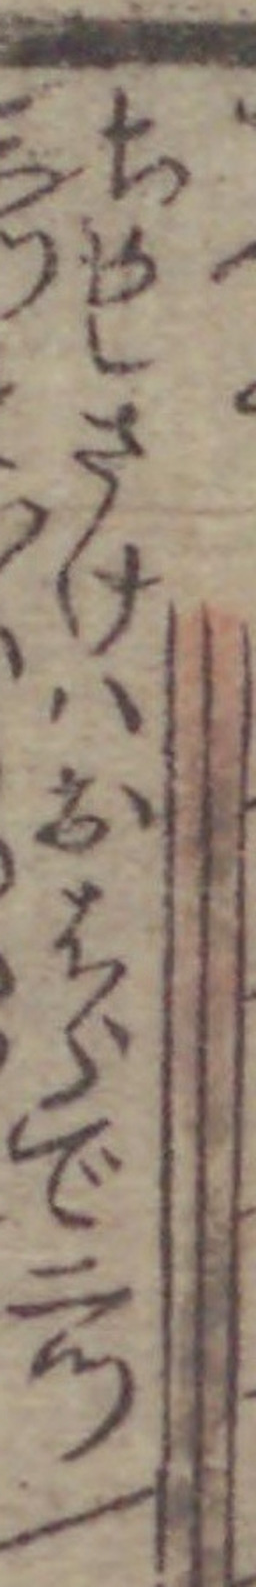ちかしさけはおはらで二ツ
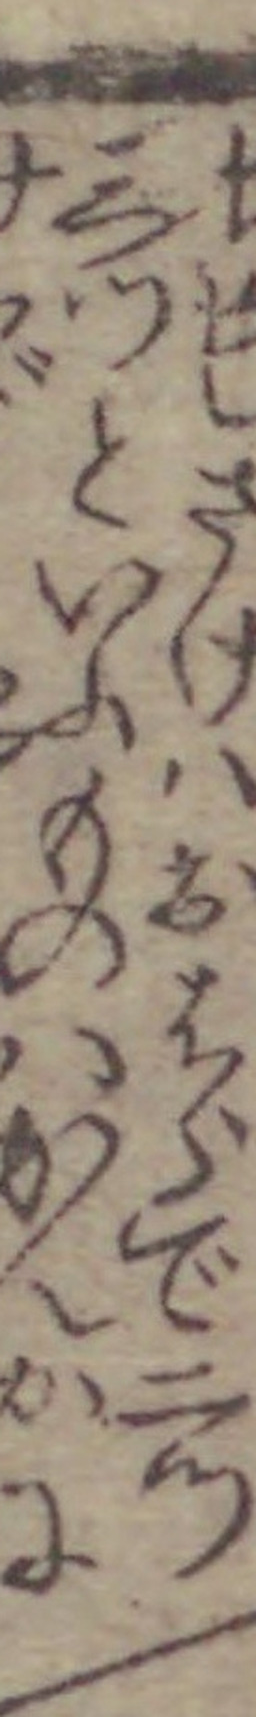三ツといふものはかんかに
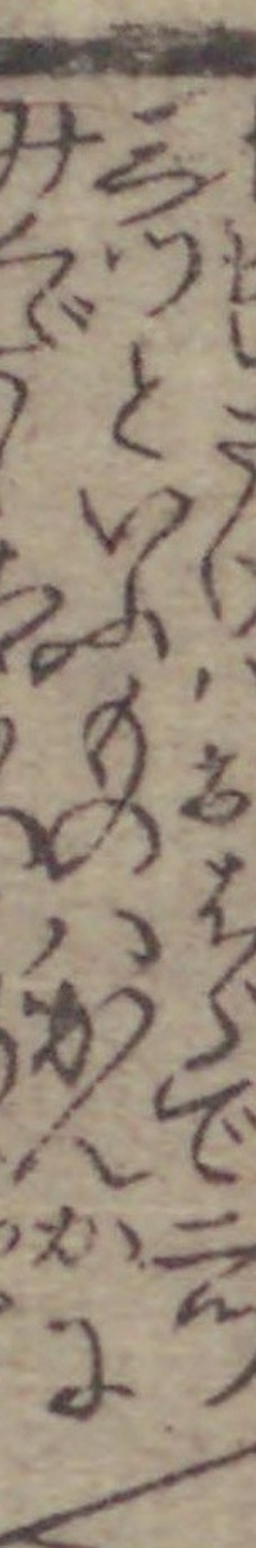三ツといふものはかんかに
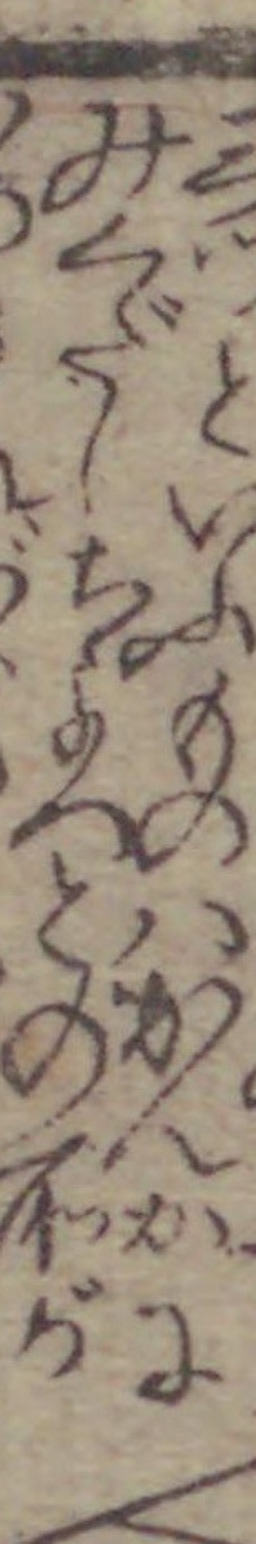みくだしちよつとの所が
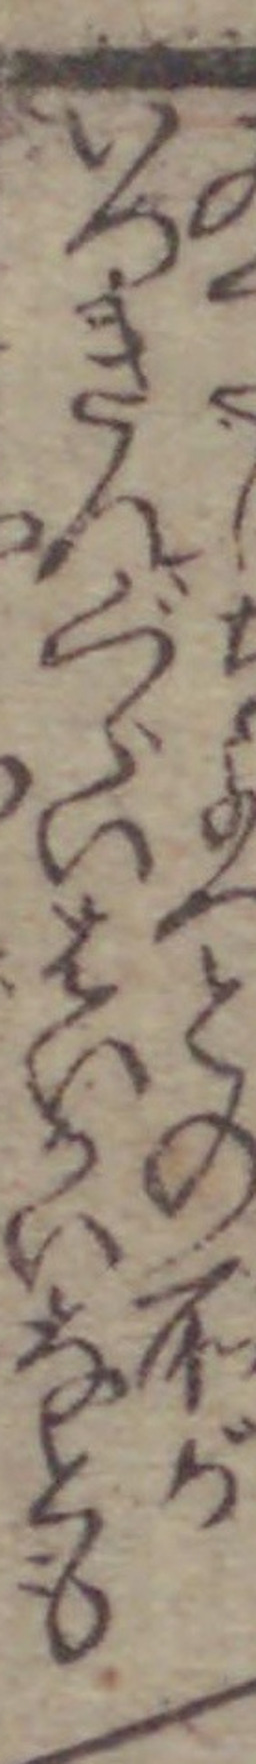いつきんぐらいはいかいなとも
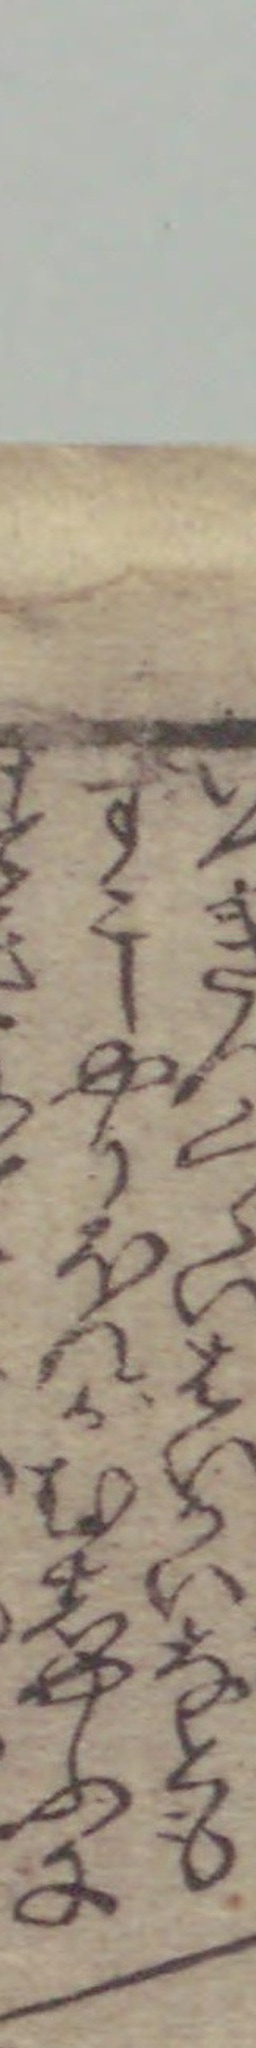すこしやりほんかむしやうに
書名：近頃嶋めぐり 3巻
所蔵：国立国会図書館 National Diet Library, JAPAN
